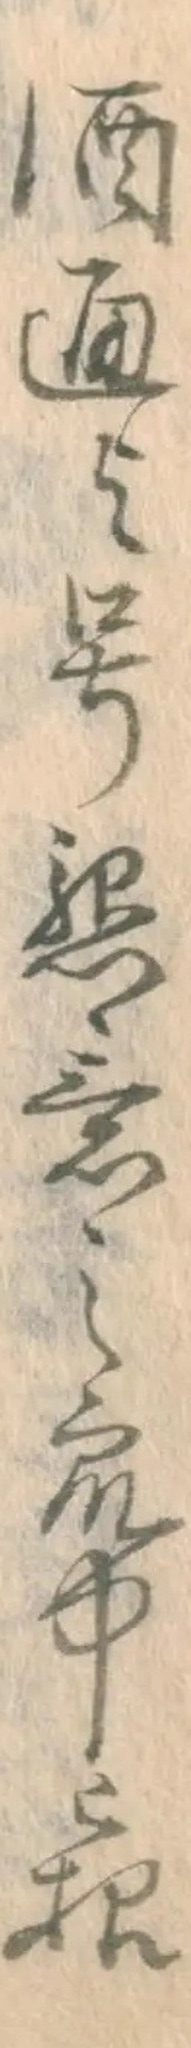酒通と号懇意之衆中被招
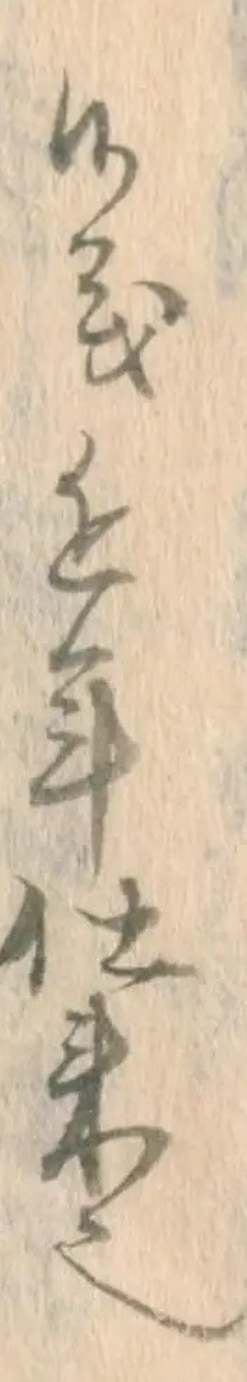候義近年仕来也
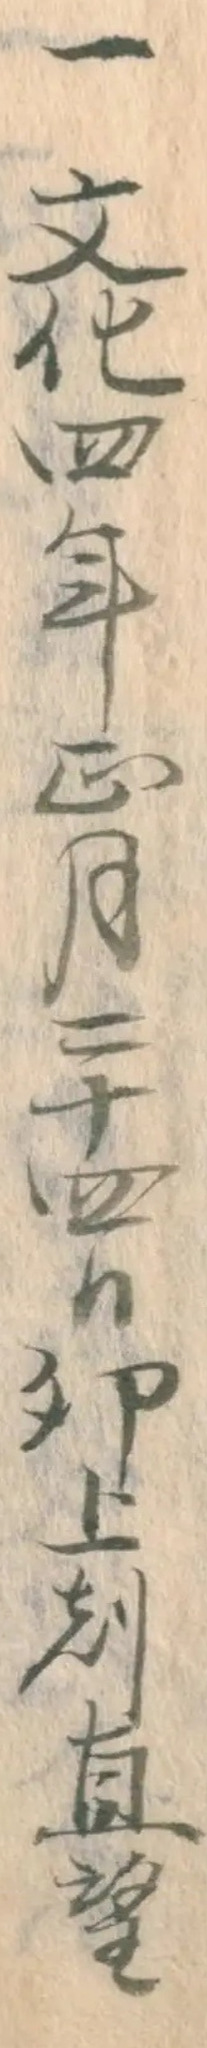一文化四年正月二十四日卯上刻直望
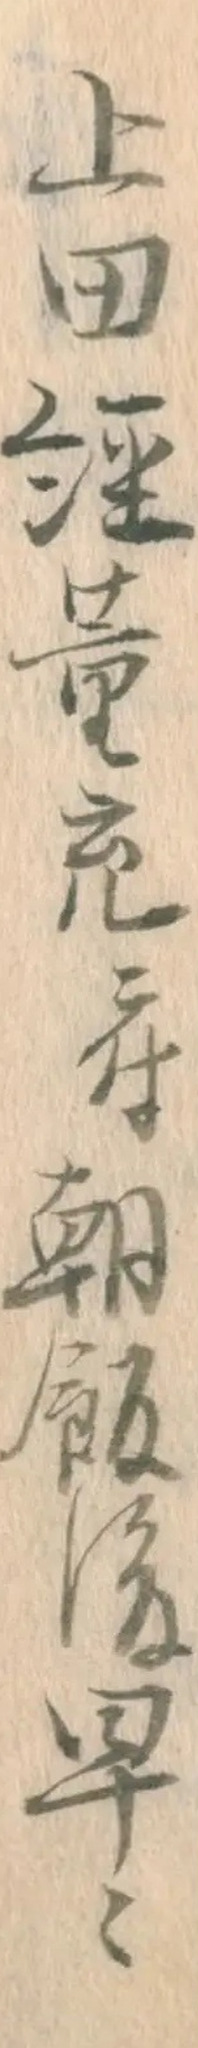上田経董充ニ付朝飯後早々
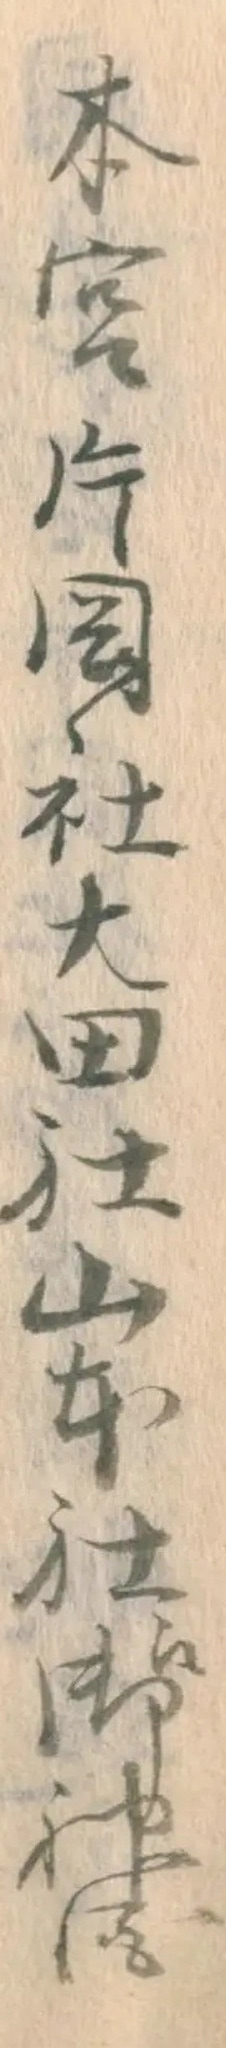本宮片岡社大田社山本社え御神酒
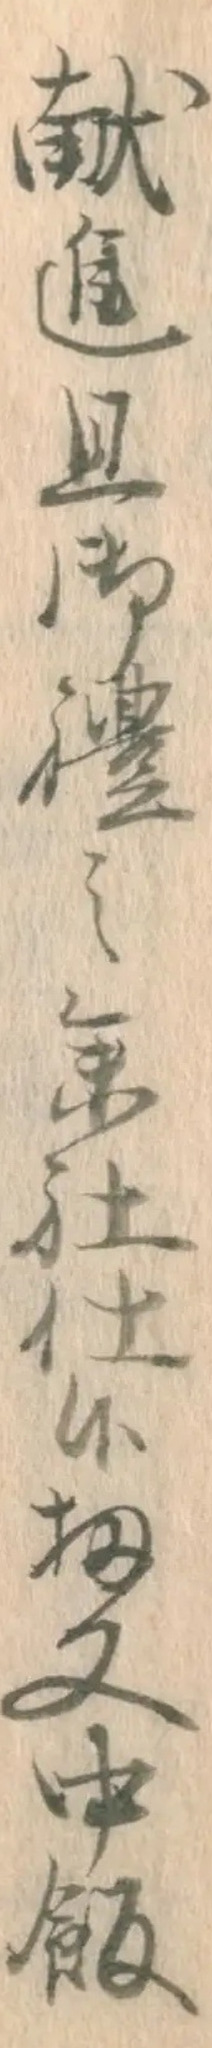献進且御禮之参社仕候扨又中飯
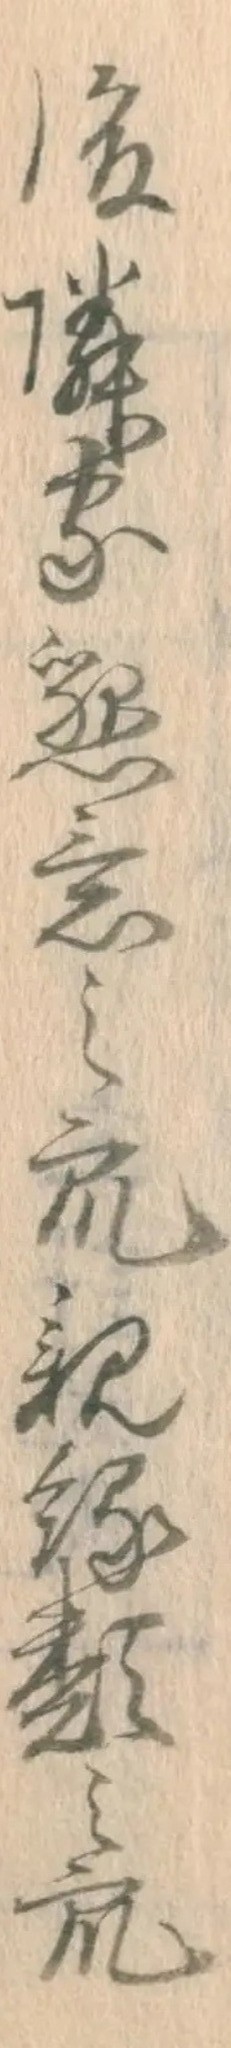後隣家懇意之衆親縁類之衆
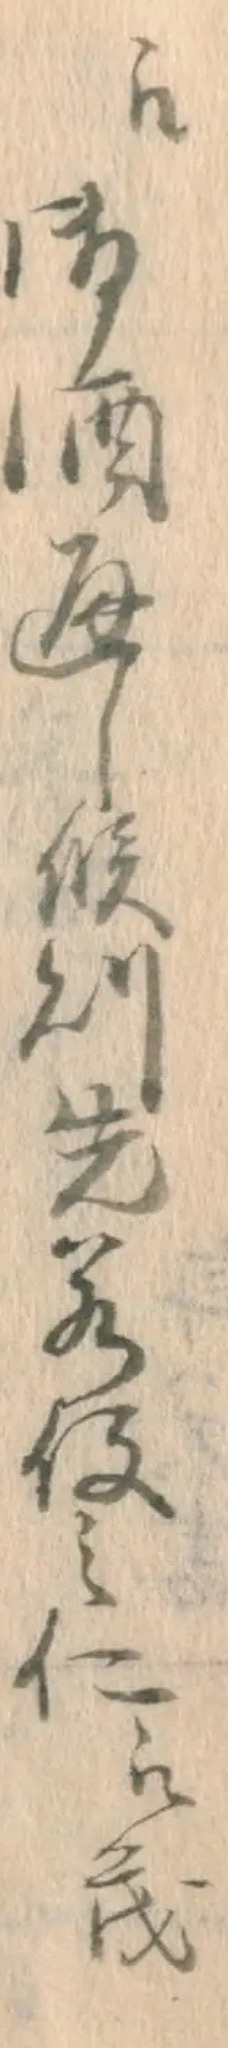え有酒通し候則先若役之仁えも
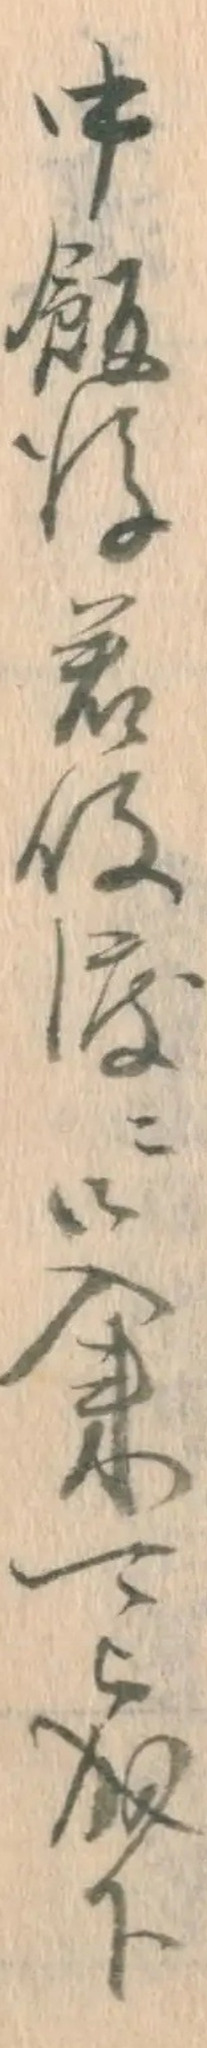中飯後若役渡ニ御入来可被成下
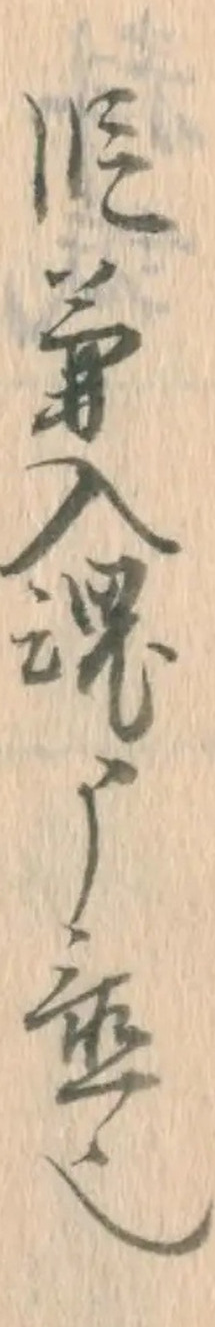段兼入魂申置也
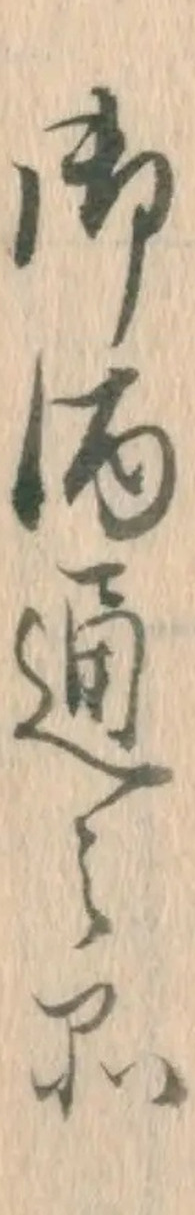御酒通之品
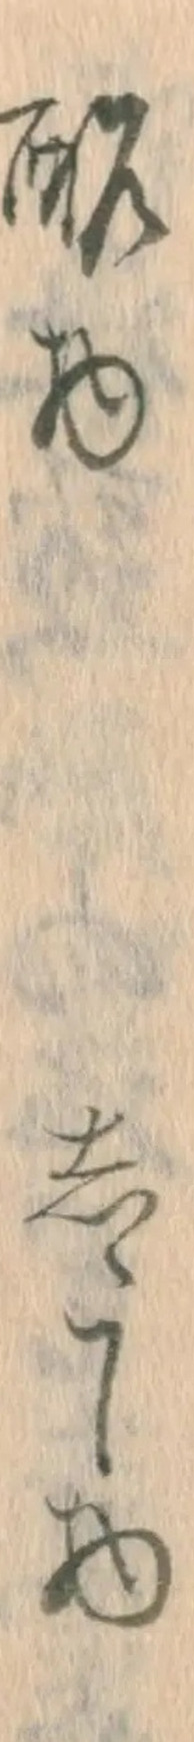酢物しゝて物
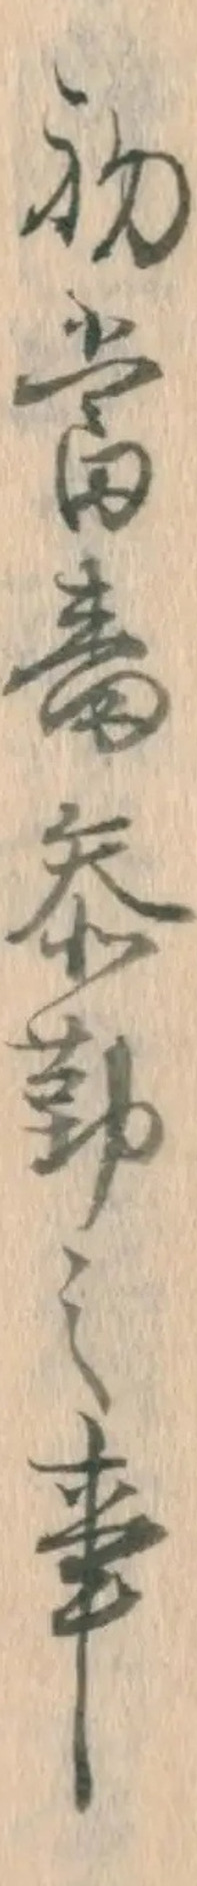初当番参勤之事
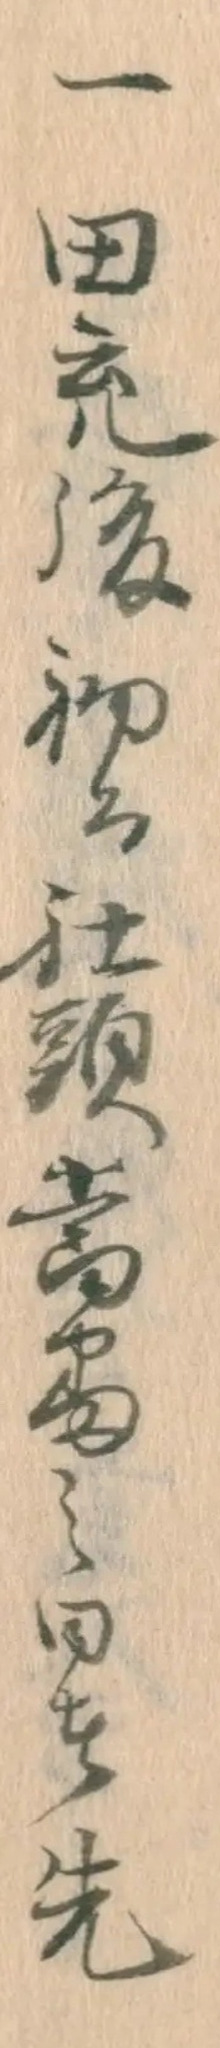一田充後初而社頭當番之日者先
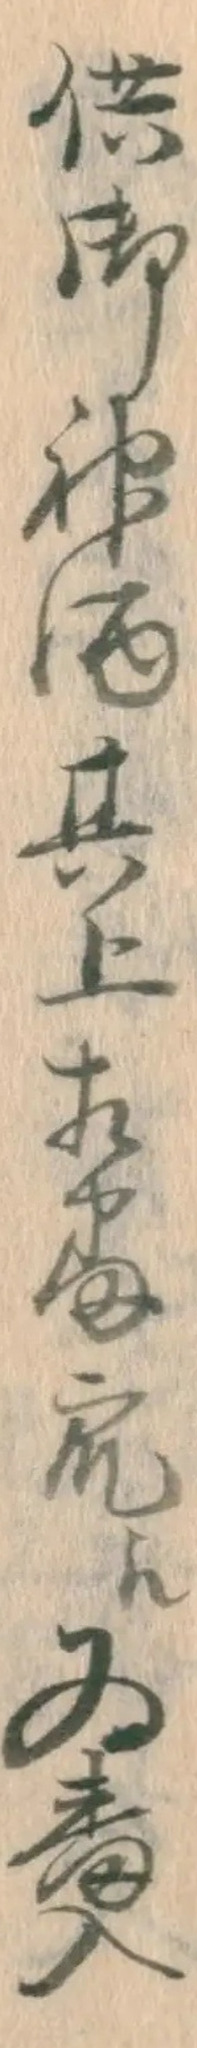供御神酒其上相番衆え為番入
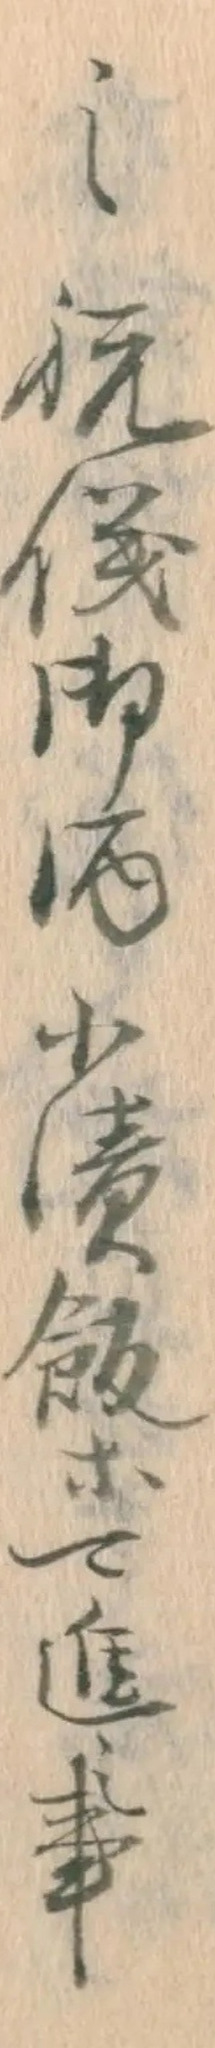之祝儀御酒小漬飯等可進之事
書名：賀茂社記録. 第81冊
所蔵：国立国会図書館 National Diet Library, JAPAN
